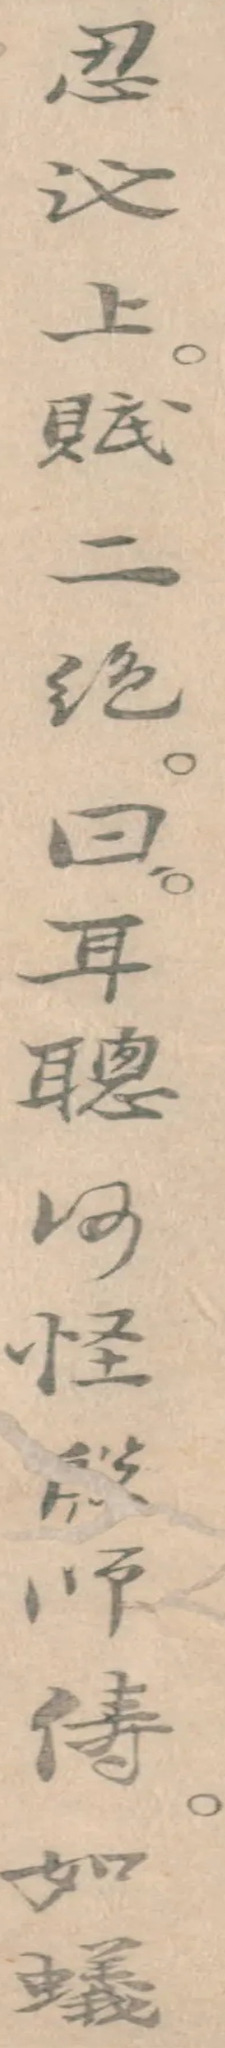忍池上。賦二絶。曰。耳聡仍怪殷師儔。如蟻
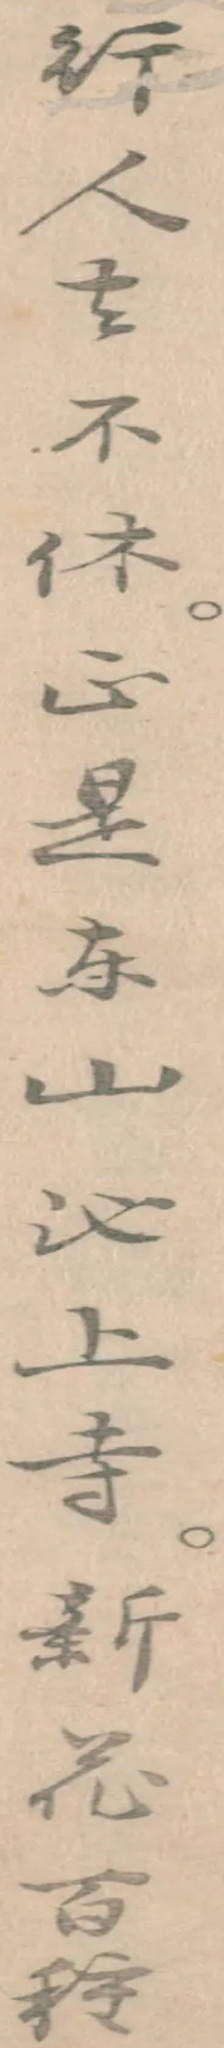行人者不休。正是東山池上寺。新花百種
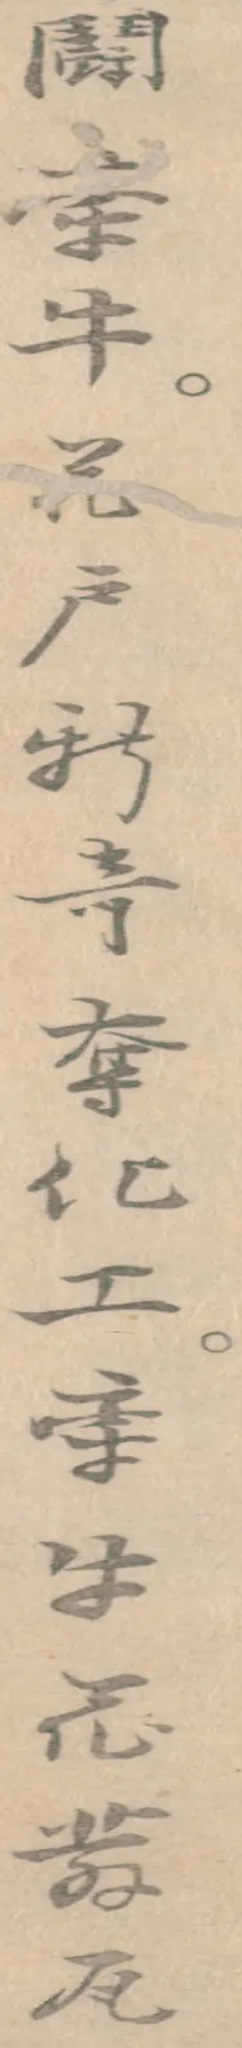闘牽牛。花戸新奇奪化工。牽牛花散瓦
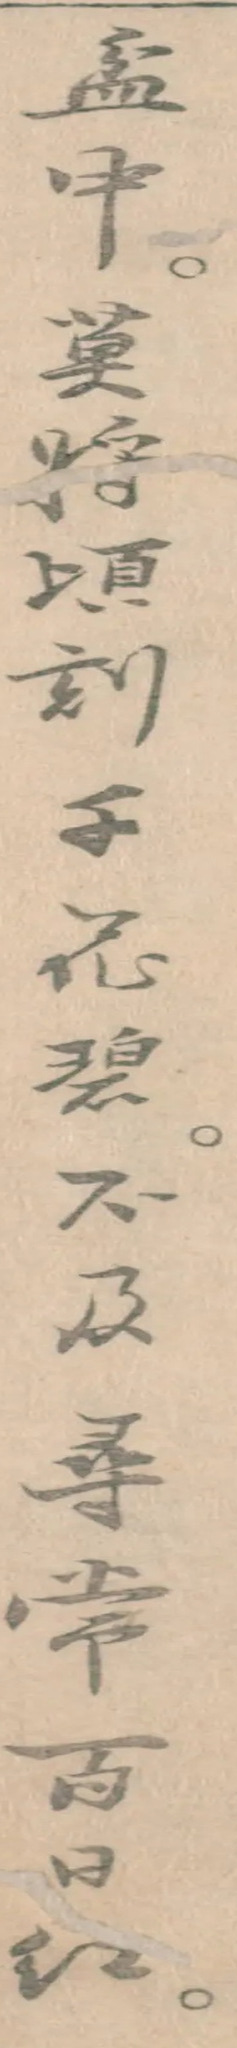盆中。莫将頃刻千花碧。不及尋常百日紅。
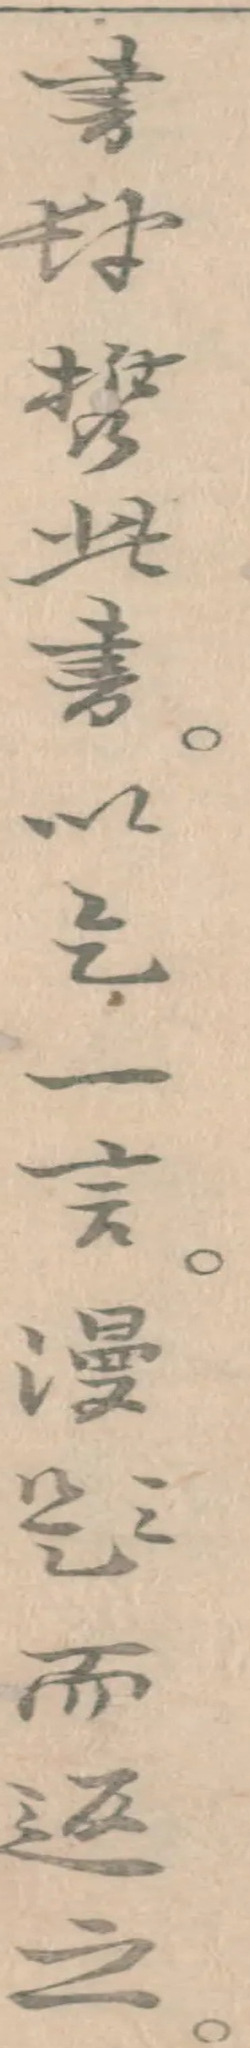書肆携此書。以乞一言。漫題而返之。
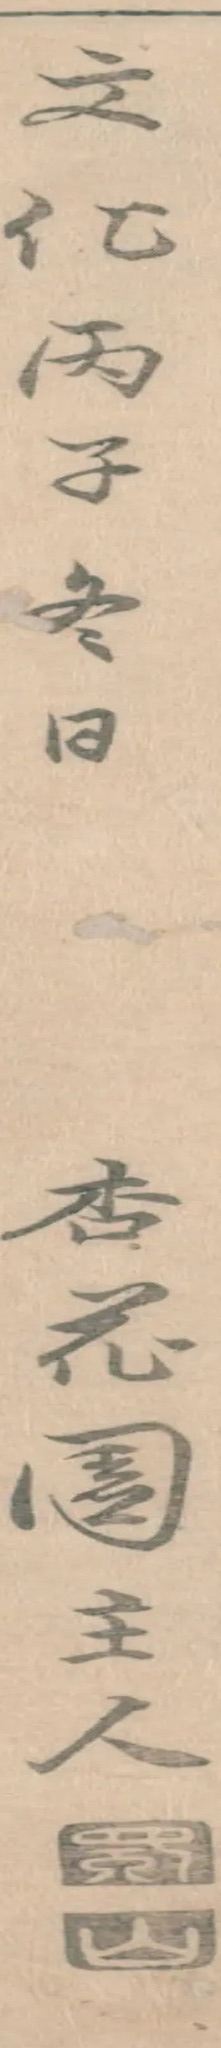文化丙子冬日杏花園主人
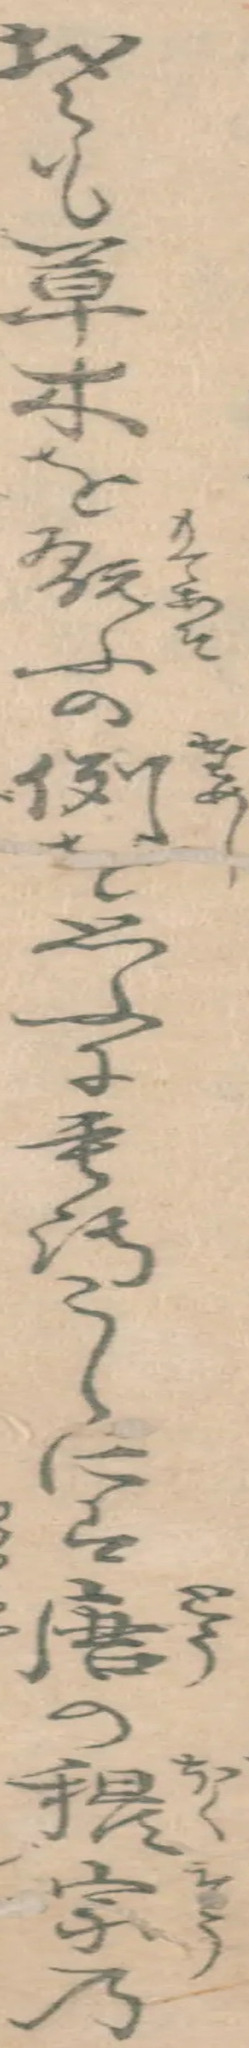そも草木を翫ふの例を思ふにもろこしには唐の穆宗の
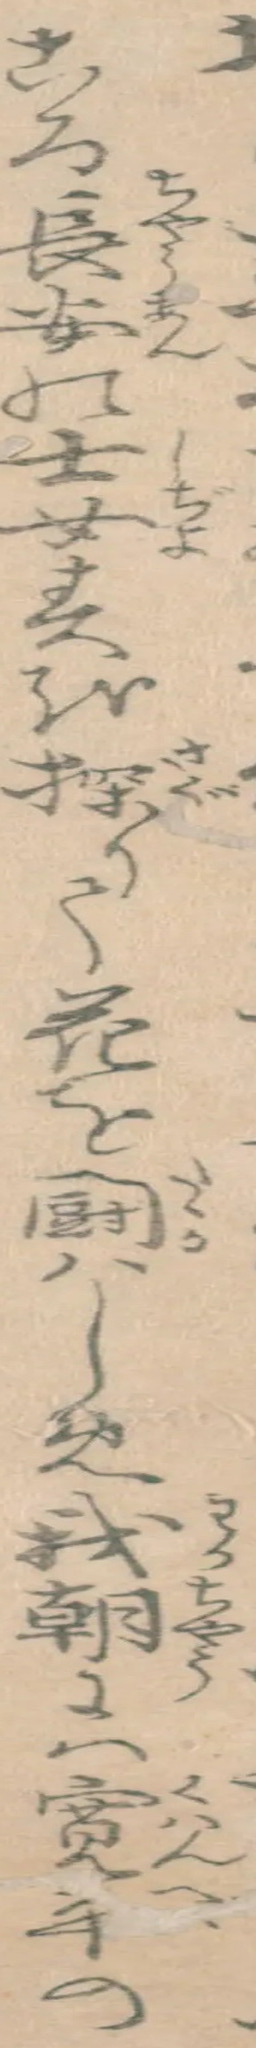ころ長安の士女春を探りて花を闘はしめ我朝には寛平の
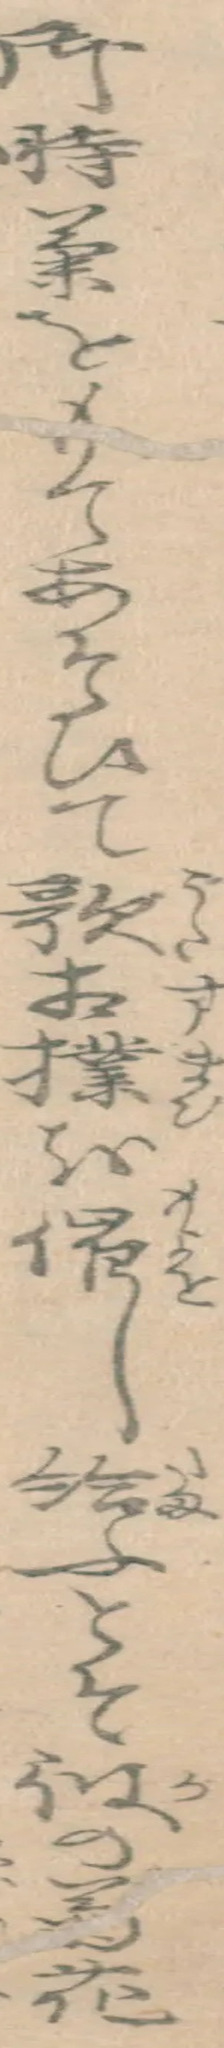御時菊をもてあそひて歌相撲を催し給ふとて彼の菊花
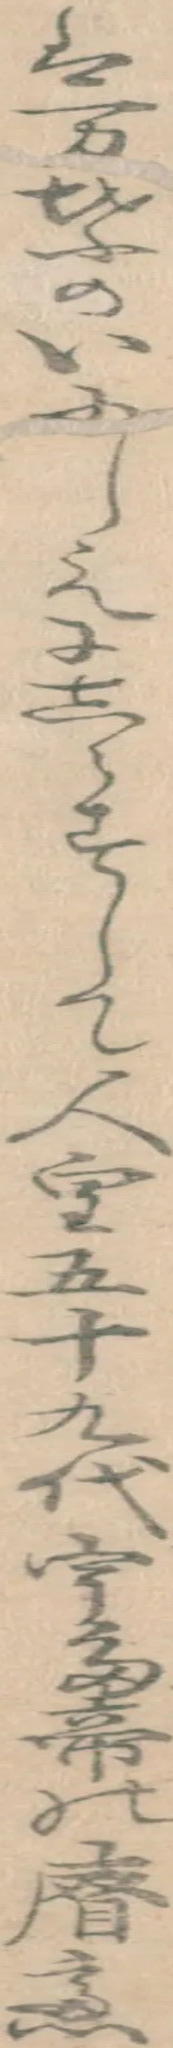は万葉のいにしえにしらすして人皇五十九代宇多帝の叡慮
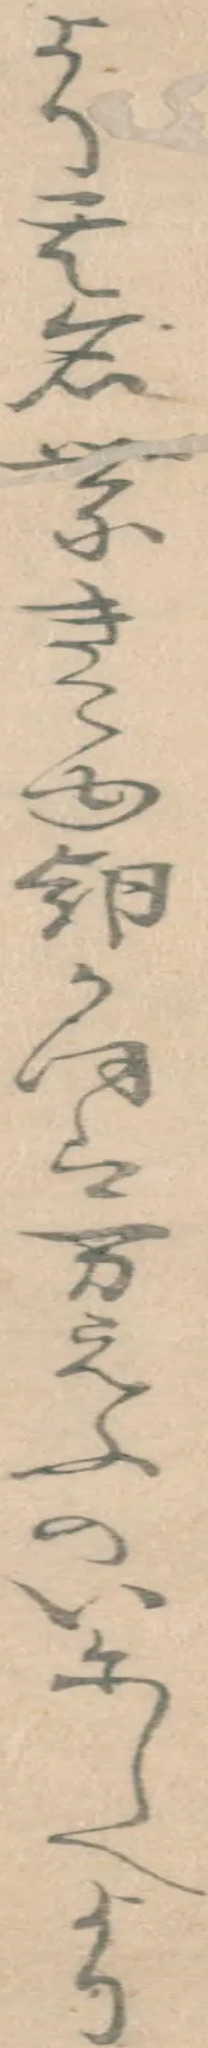より其名世にきこゆ朝かほは万えふのいにしへより
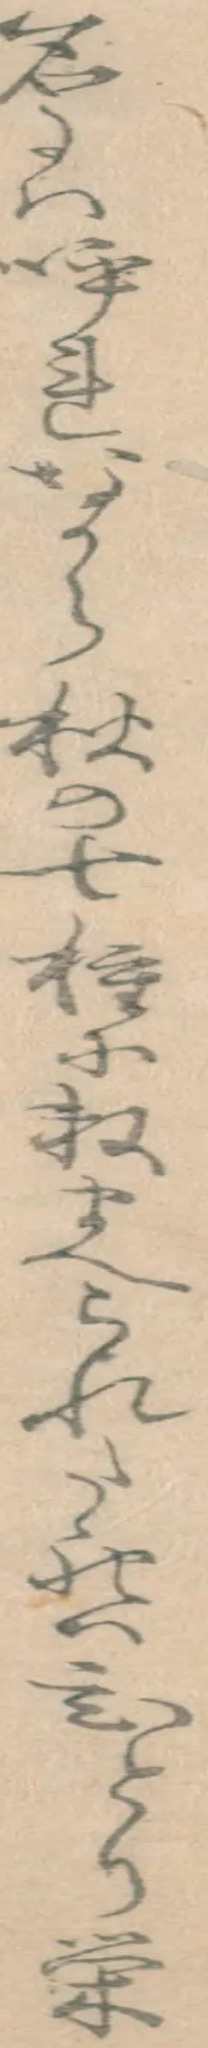名には呼れなから秋の七種に数まへられたれはひとり栄
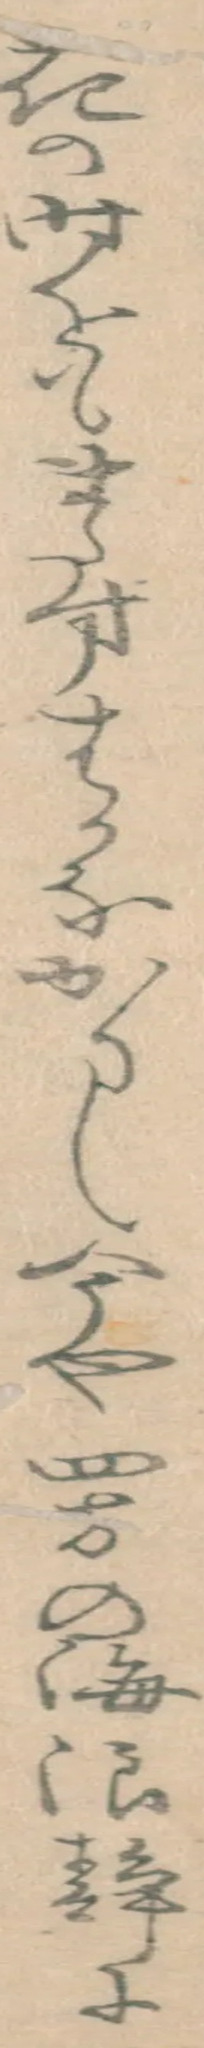花の時をもまたすはかなかりし今や四方の海浪静に
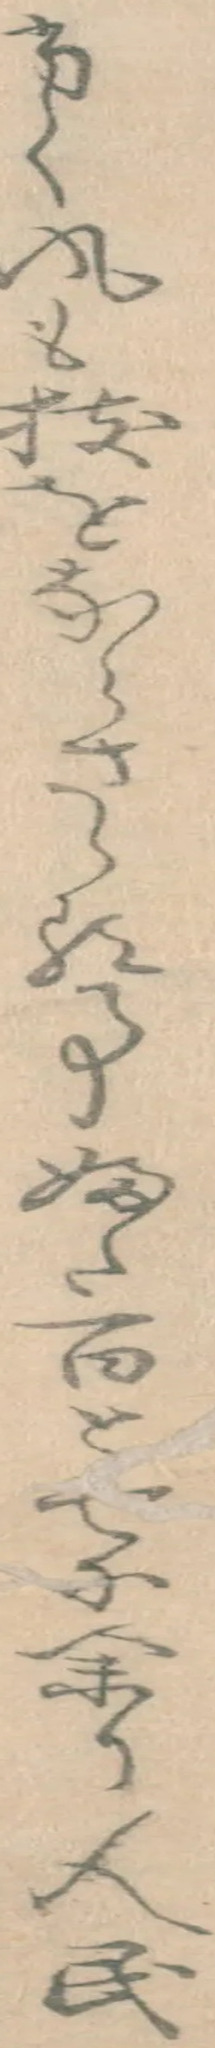ふく風も枝をならさらる事ふた百とせに余り人民
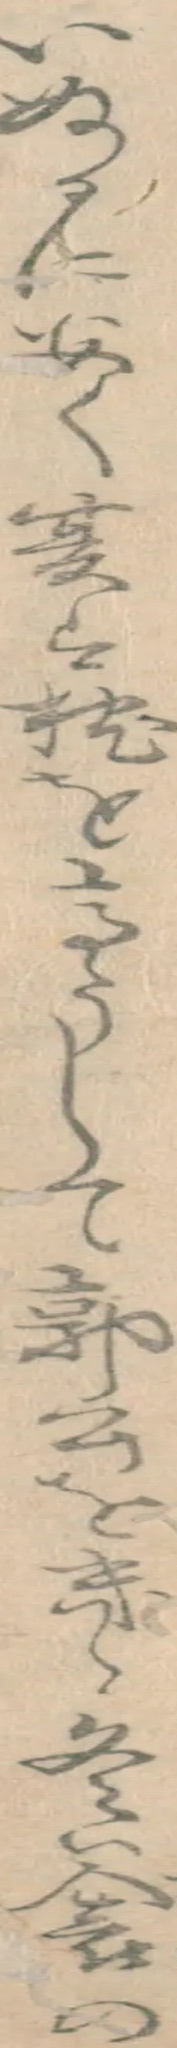いぬるに安く夏は枕を高うして郭公をきゝ冬は衾の
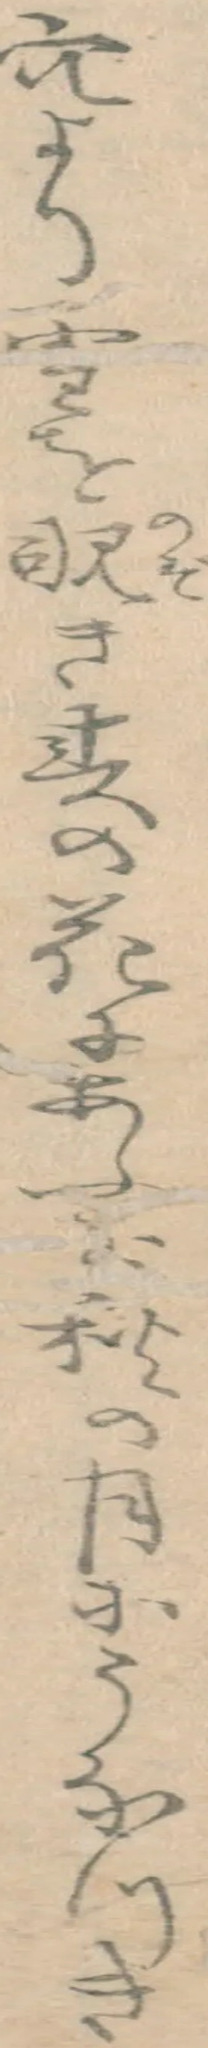穴より雪を覗き春の花にあふき秋の月にうなつき
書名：朝顔叢. 上巻
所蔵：国立国会図書館 National Diet Library, JAPAN
